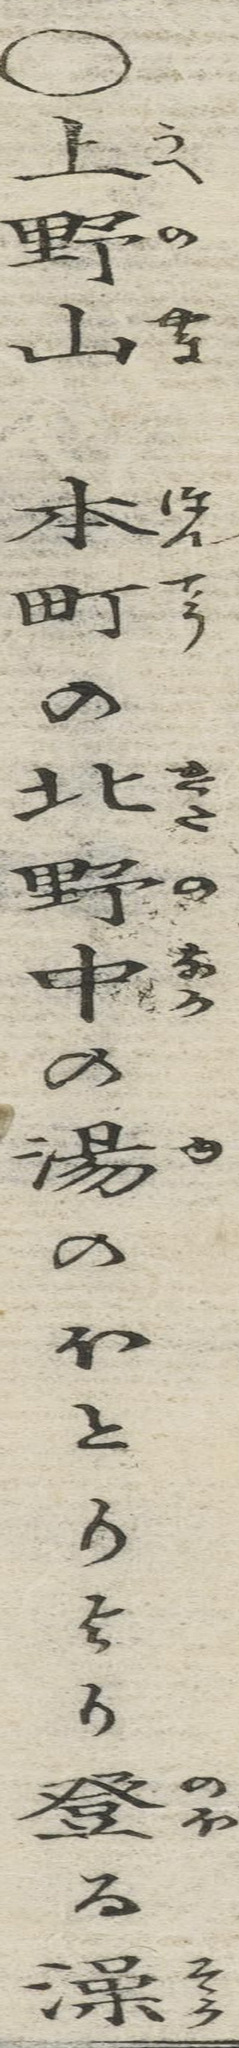○上野山本町の北野中の湯のほとりより登る澡

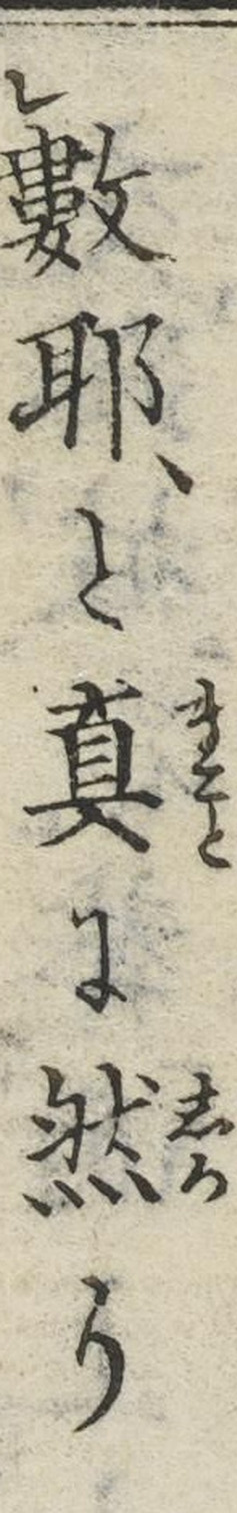数耶、と真に然り
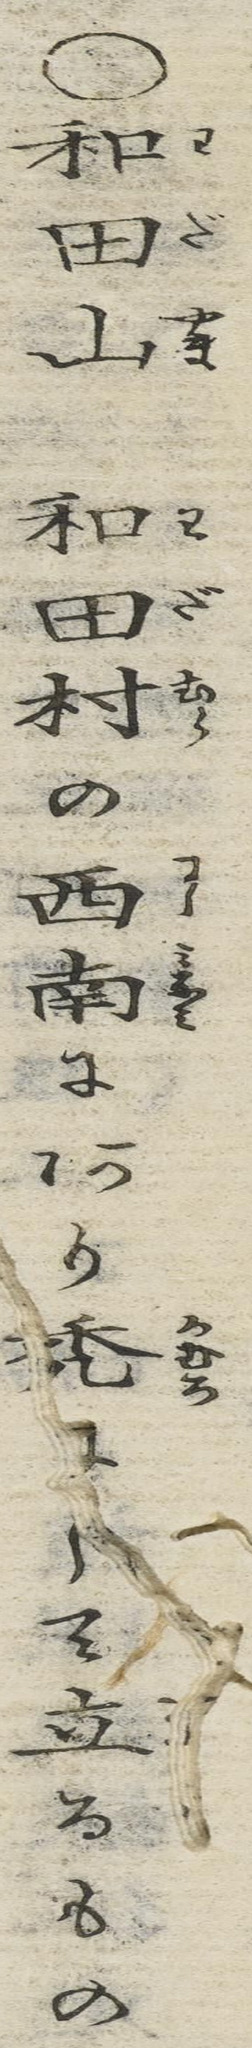○和田山和田村の西南にあり禿にして立るもの
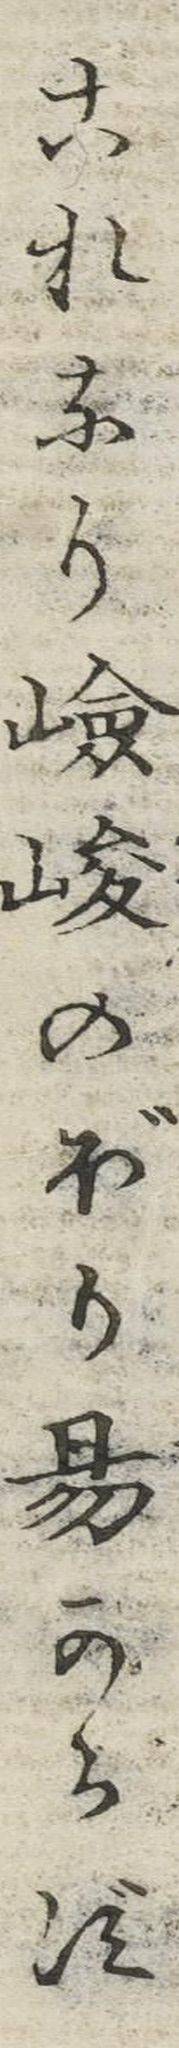これなり嶮峻のぼり易からず
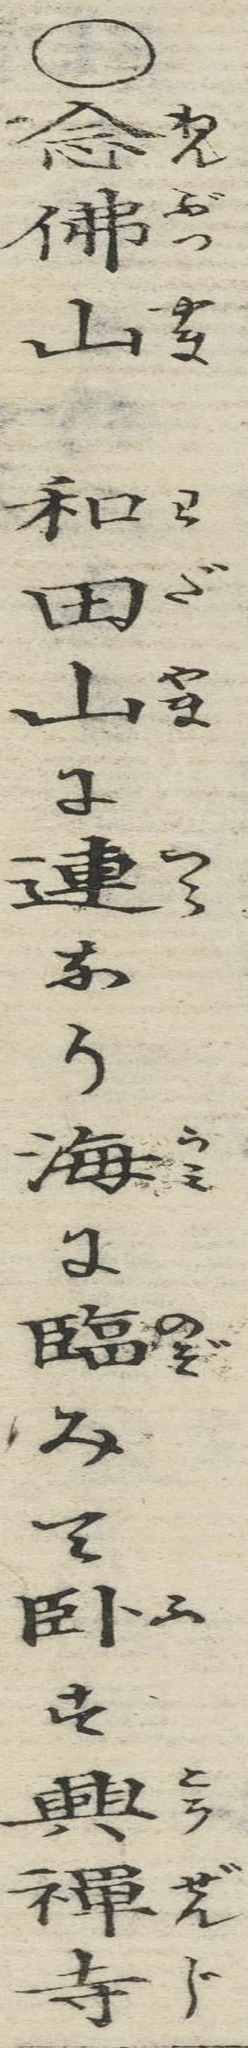○念仏山和田山に連なり海に臨みて臥す興禅寺
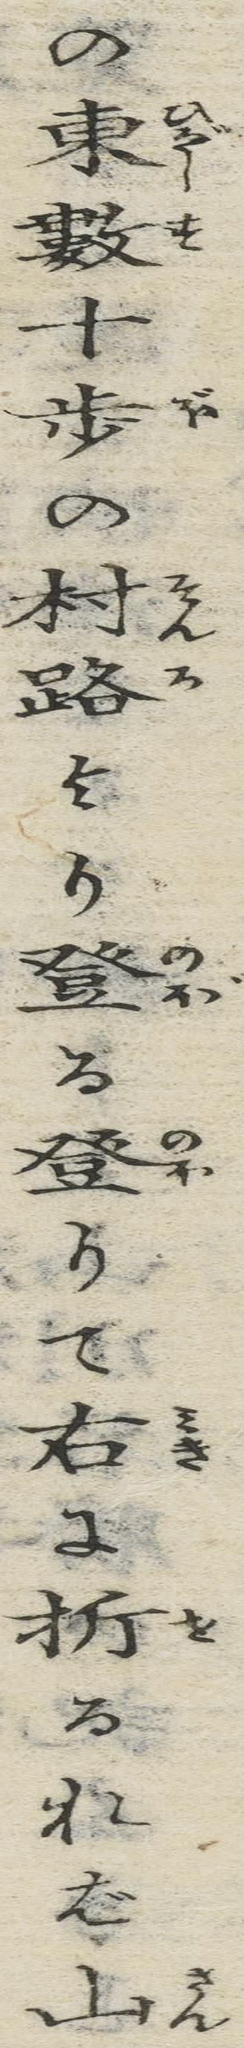の東数十歩の村路より登りて右に折るれば山
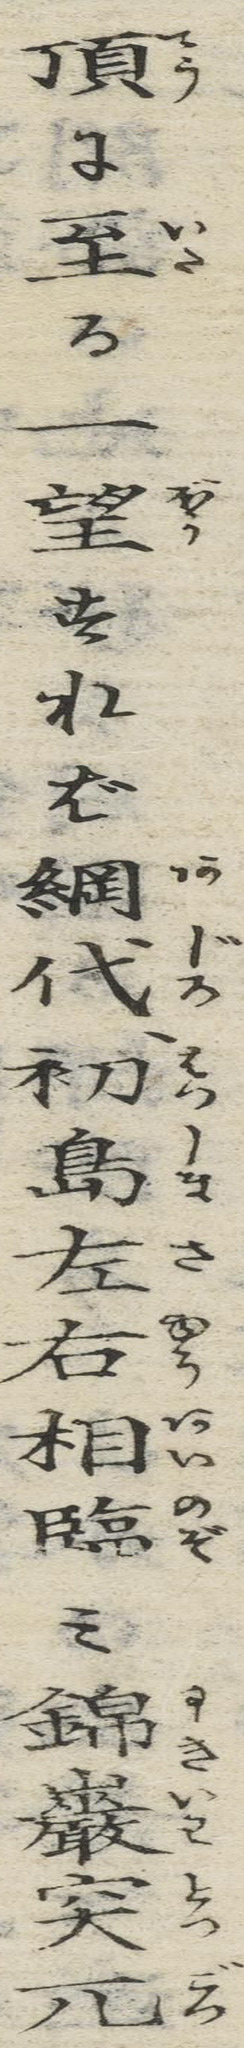頂に至る一望すれば網代、初島左右相臨み錦巌突兀
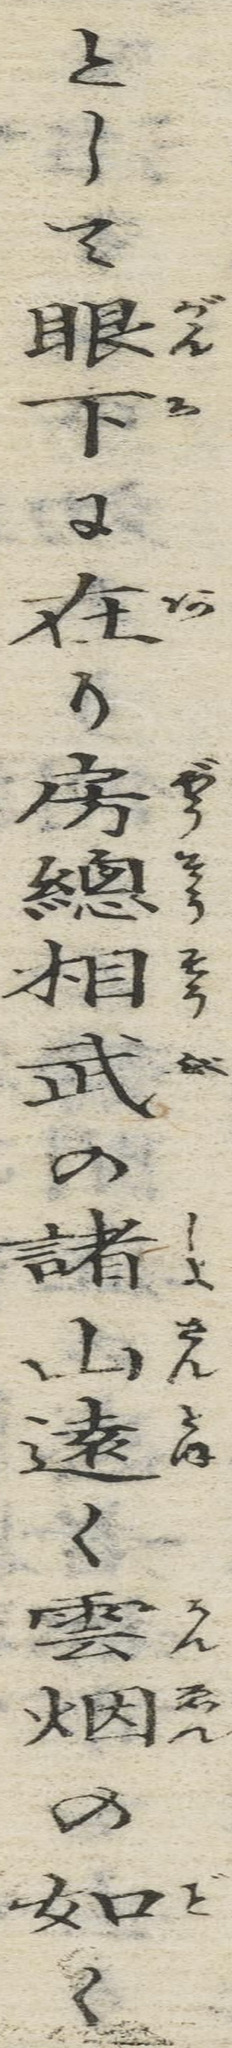として眼下に在り房総相武の諸山遠く雲烟の如く
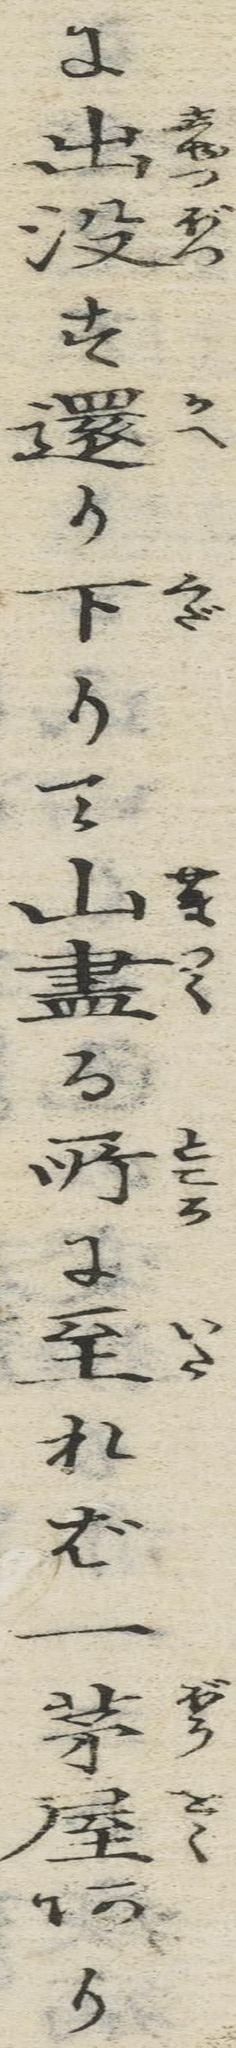に出没す還り下りて山尽る所に至れば一茅屋あり
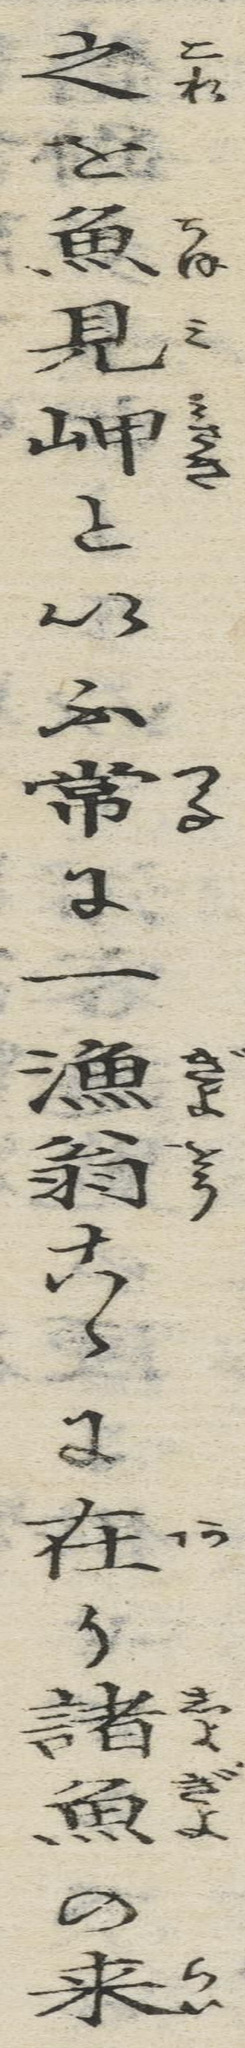之を魚見岬といふ常に一漁翁こゝに在り諸魚の来
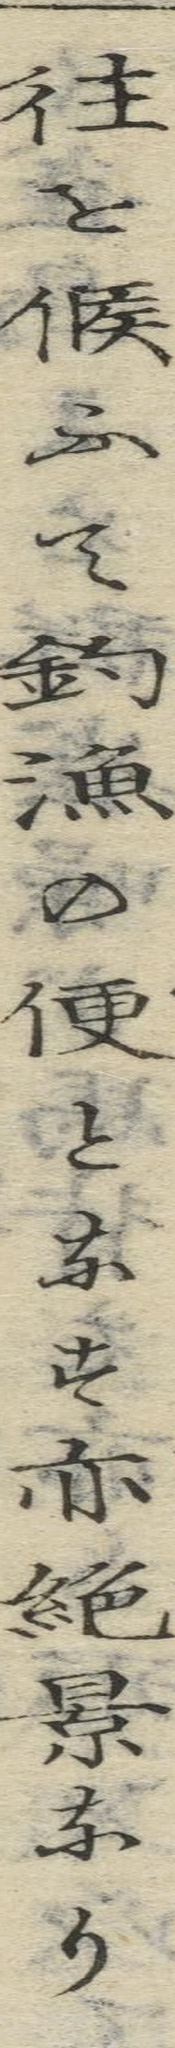往を候ふて釣漁の便となす亦絶景なり
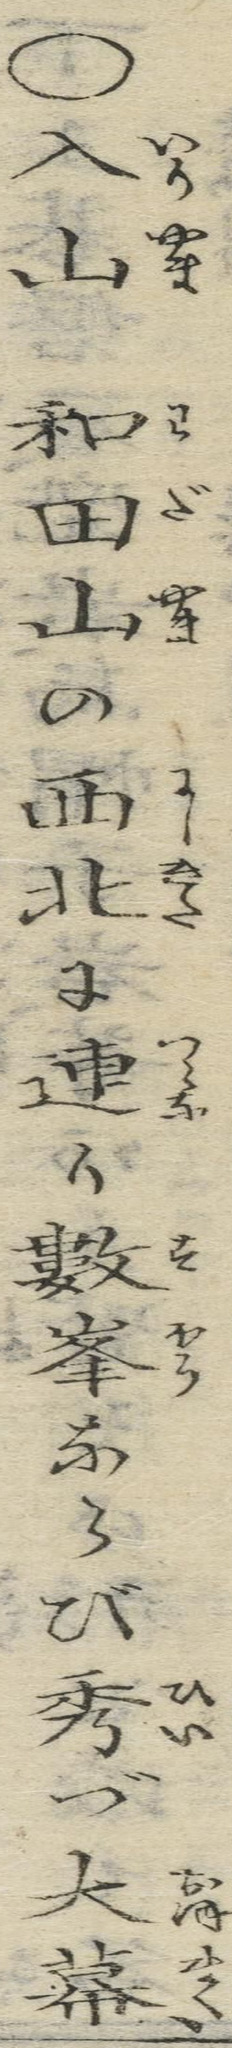○入山和田山の西北に連り数峰ならび秀づ大幕、
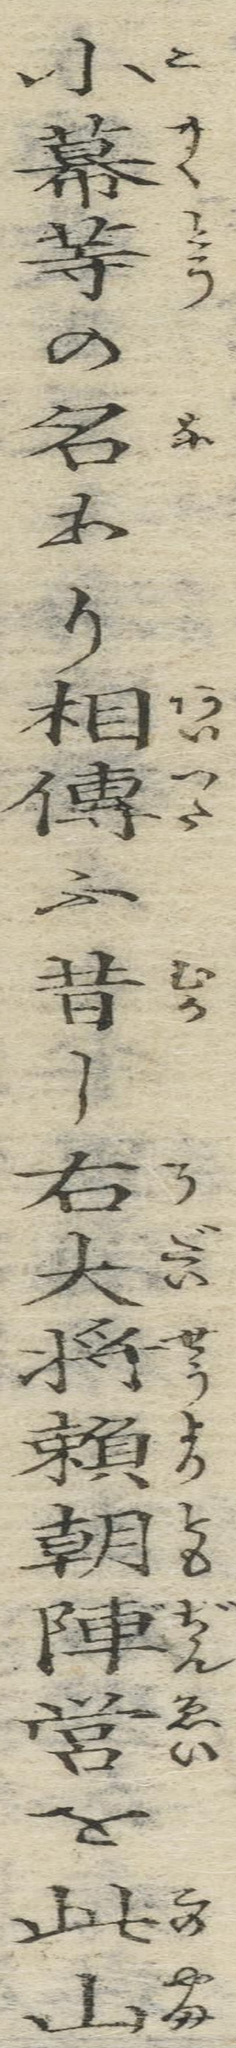小幕等の名あり相伝ふ昔し右大将頼朝陣営を此山
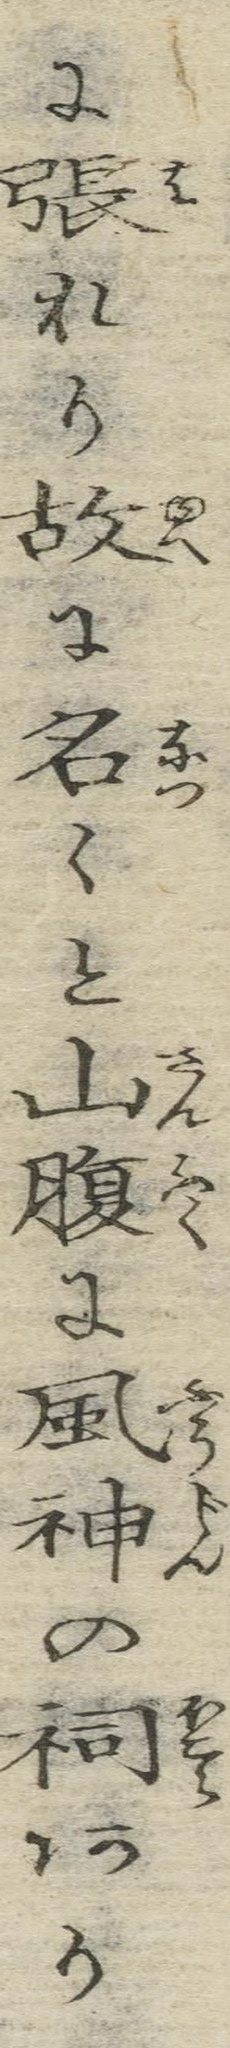に帳れり故に名くと山腹に風神の祠あり
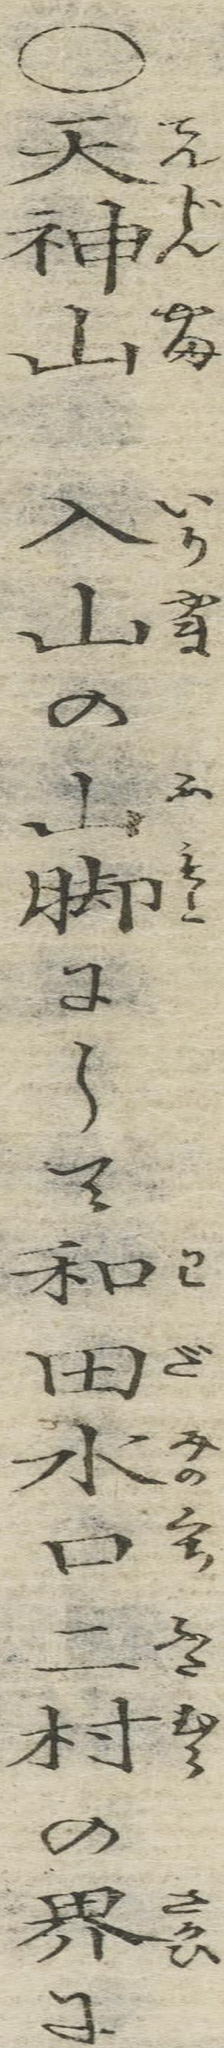○天神山入山の山脚にして和田水口二村の界に
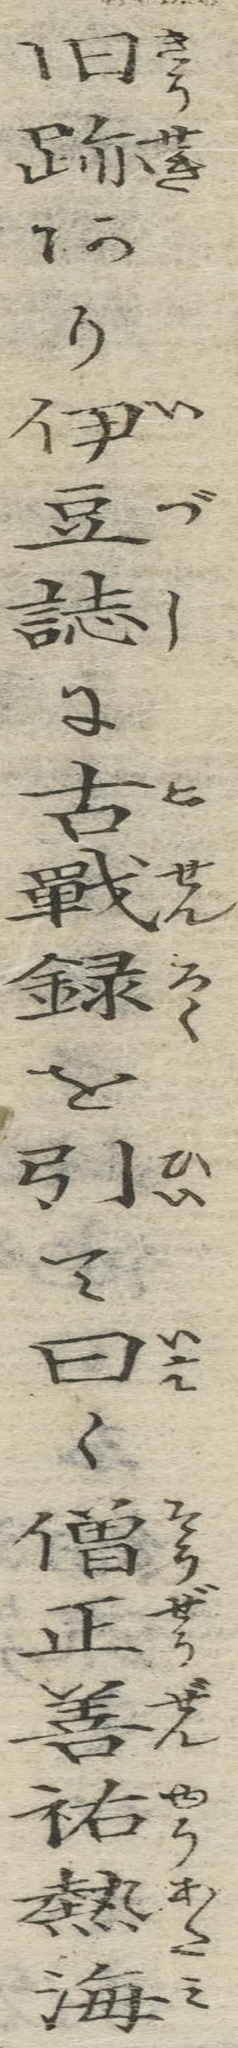旧跡あり伊豆誌に古戦録を引て曰く僧正善祐熱海
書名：豆州熱海誌　完
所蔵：東京大学地震研究所図書室 Earthquake Research Institute Library, The University of Tokyo, JAPAN
